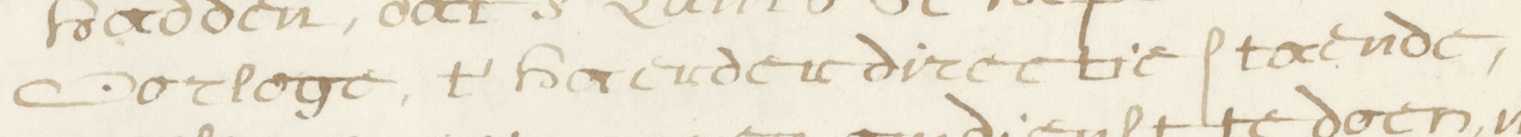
Oorloge, t' haerder directie staende,
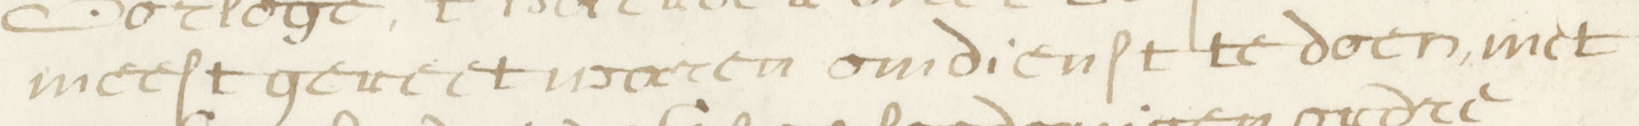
meest gereet waren om dienst te doen, met
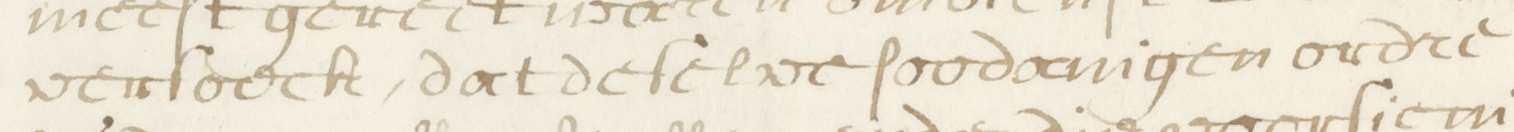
versoeck, dat deselve soodanigen ordre
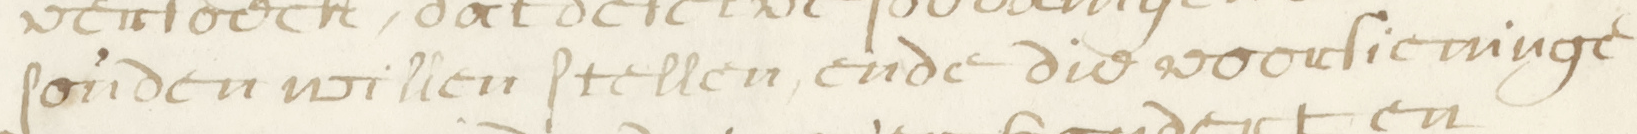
souden willen stellen, ende die voorsieninge
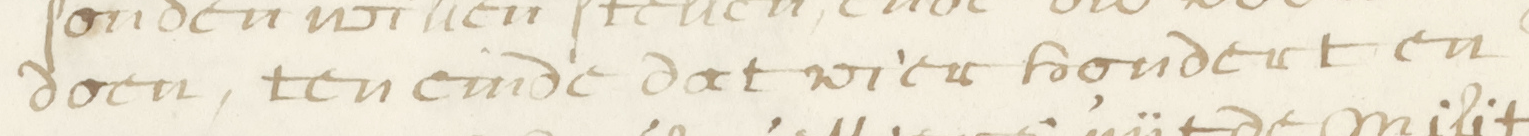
doen, ten einde dat vier hondert en
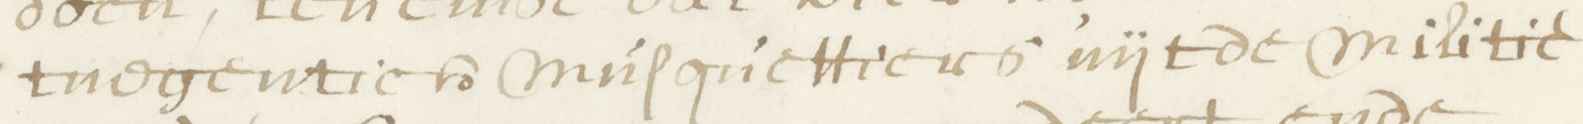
tnegentich musquettiers uijt de militie
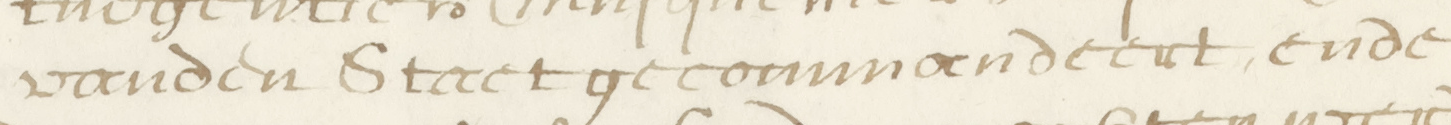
vanden Staet gecommandeert, ende
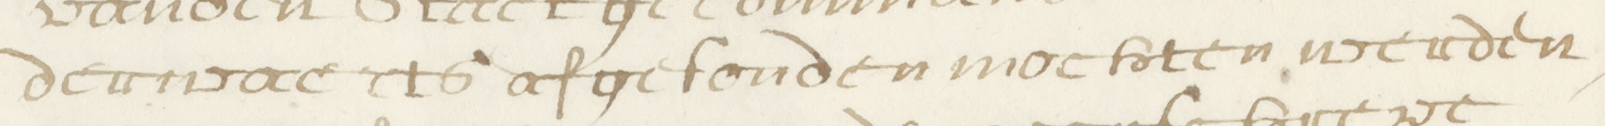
derwaerts afgesonden mochten werden,
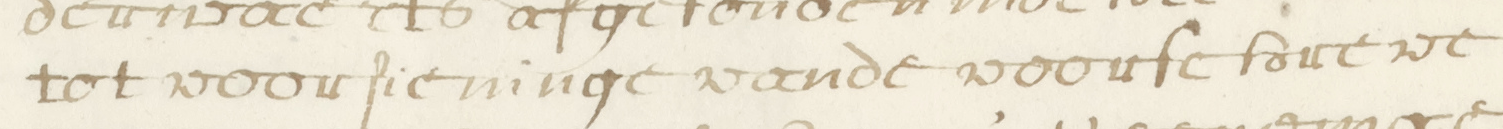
tot voorsieninge vande voorschreve
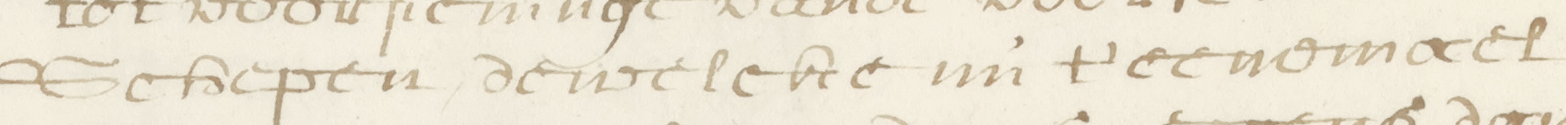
Schepen, denwelcke nu t'eenemael
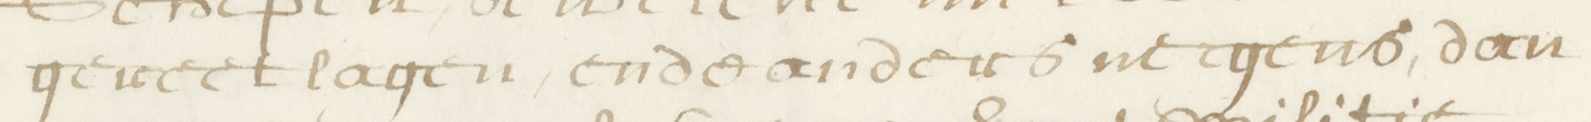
gereet lagen, ende anders nergens dan
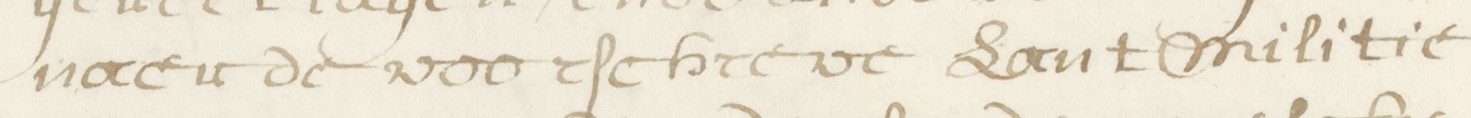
naer de voorschreve Lantmilitie
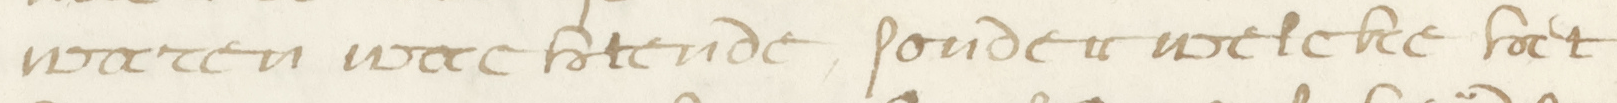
waren wachtende, sonder welcke het
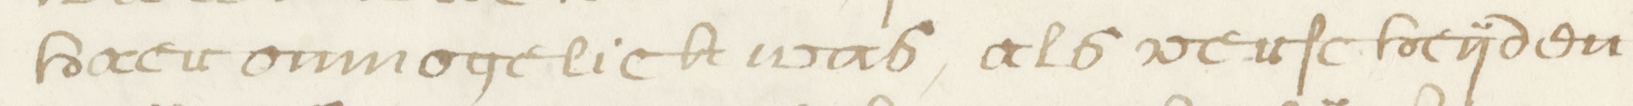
haer onmogelick was, als verscheijden
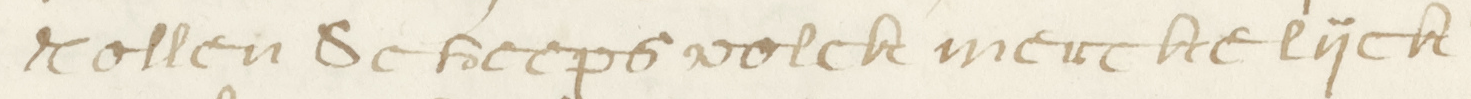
rollen Scheepsvolck merckelijck
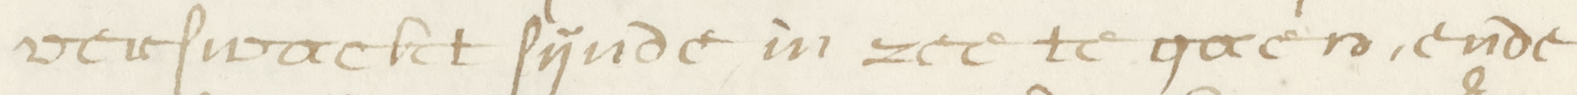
verswackt sijnde in zee te gaen, ende
